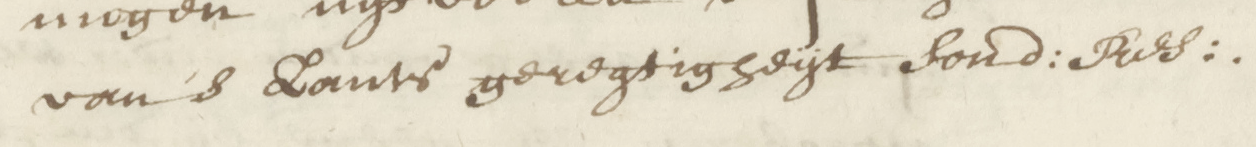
van ‛s Lants geregtigheijt sond: Res:
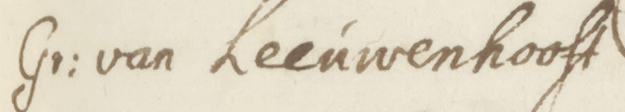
Gr: van Leeuwenhooft
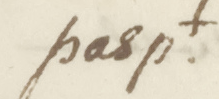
Paspt.
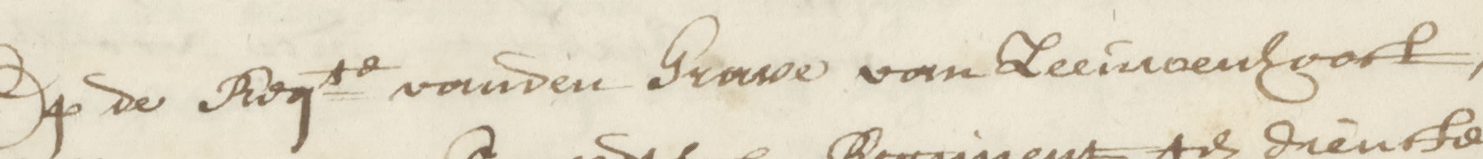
Op de Reqte vanden Grave van Leeuwenhooft
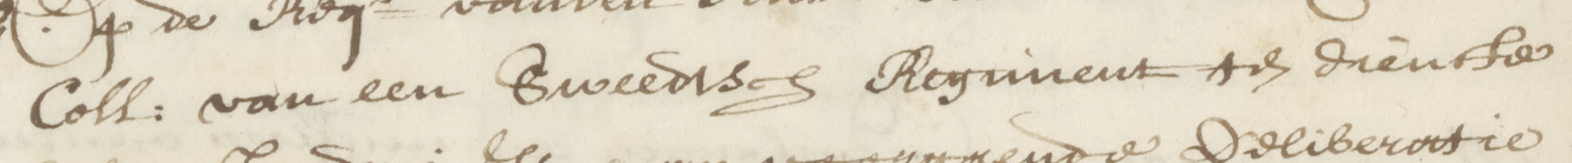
Coll: van een Sweedtsch Regiment ten dienste
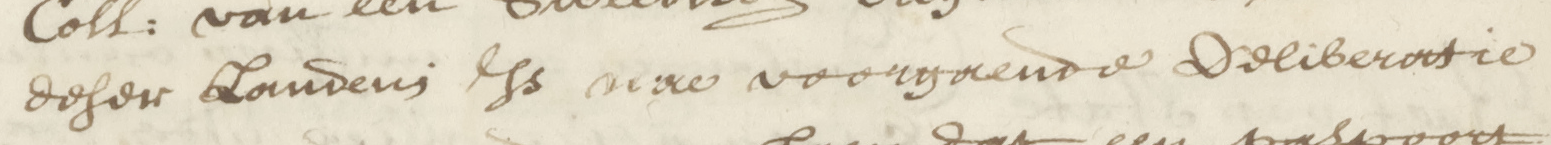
deser Landen: Is nae voorgaende deliberatie
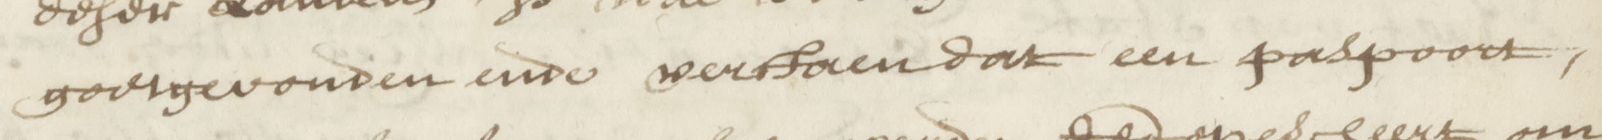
goetgevonden ende verstaen dat een paspoort.
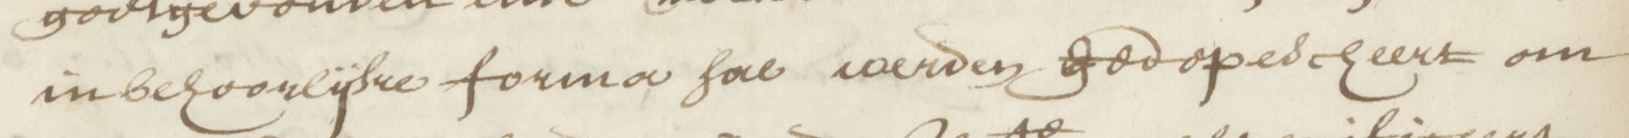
in behoorlijke forma sal werden gedepescheert om
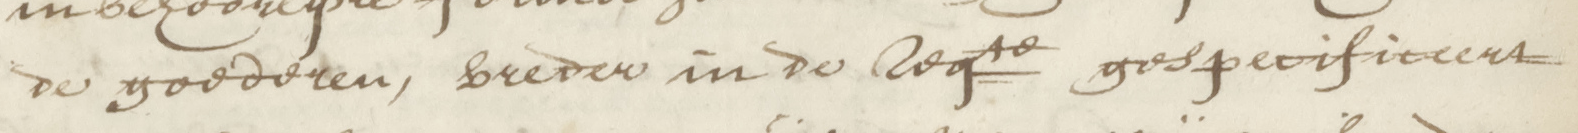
de goederen, breder in de reqte gespecificeert
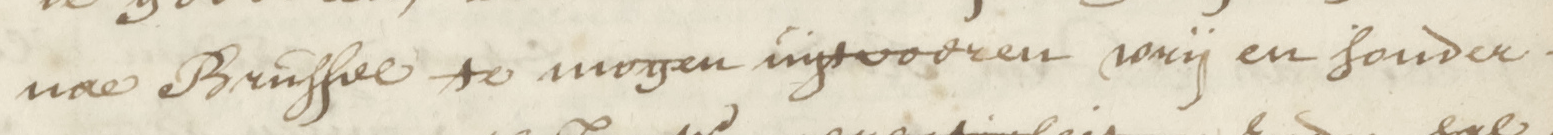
nae Brussel te mogen uijtvoeren vrij en sonder
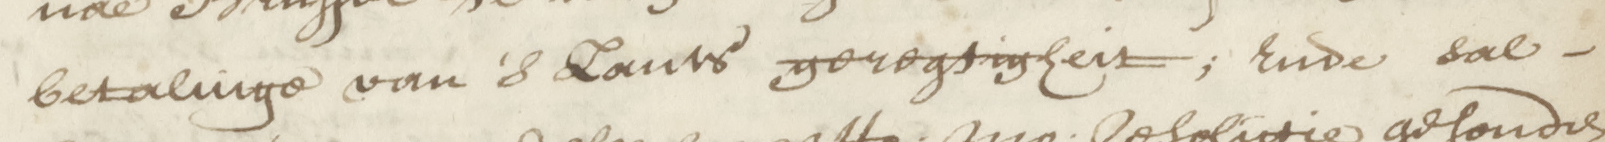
betalinge van ‛s Lants geregtigheit; ende sal -
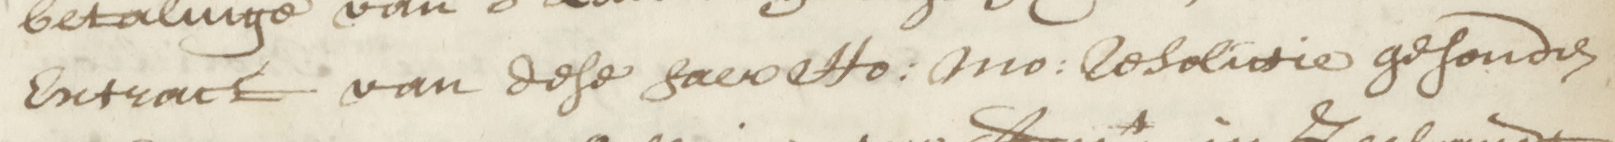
Extract van dese haer Ho:Mo: resolutie gehouden
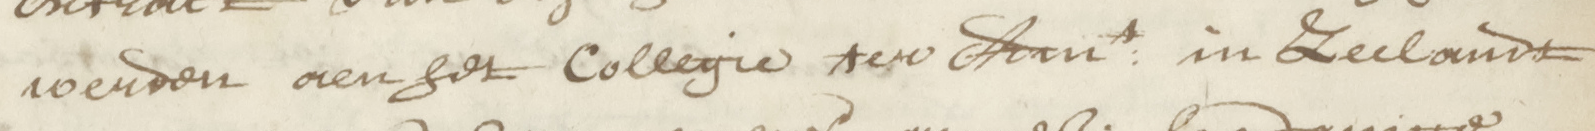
werden aen het Collegie ter Admt. in Zeelandt
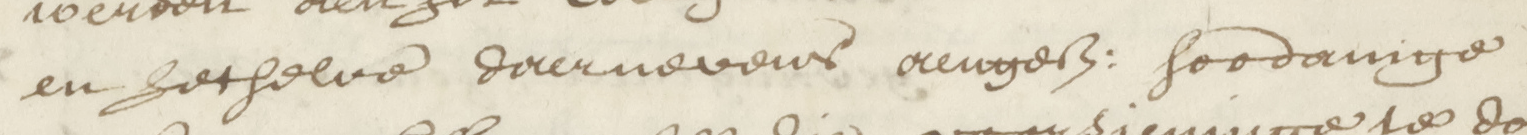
en hetselve daernevens aenges: soodanige
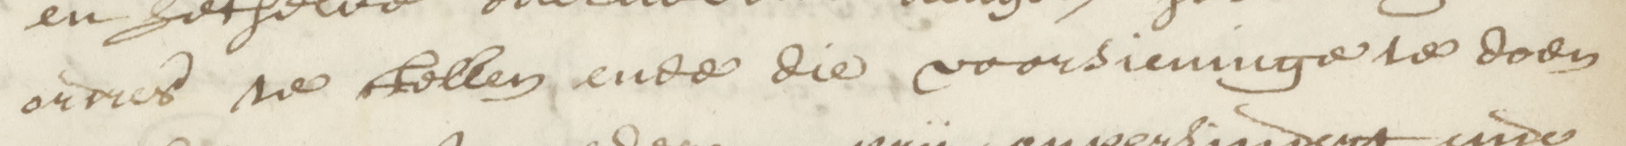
ordes te stellen ende die voorsieninge te doen
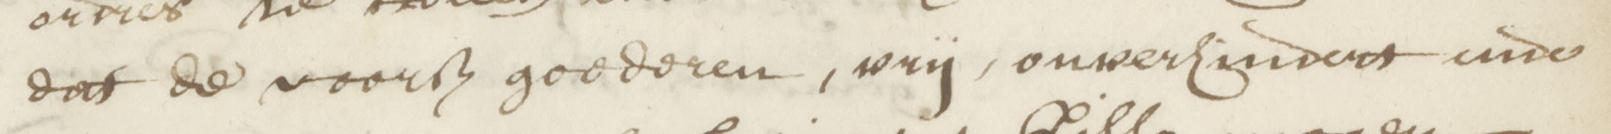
dat de voors goederen, vrij, onverhindert ende
